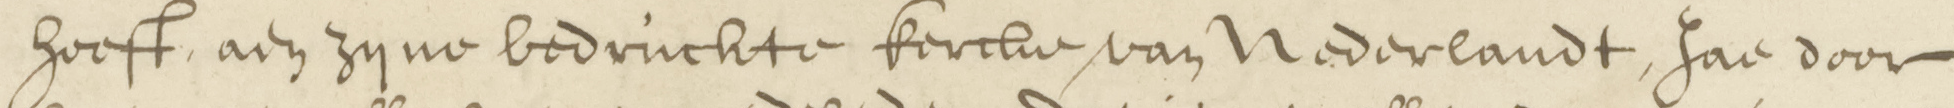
heeft, aen zyne bedruckte kercke van Nederlandt, Jae door
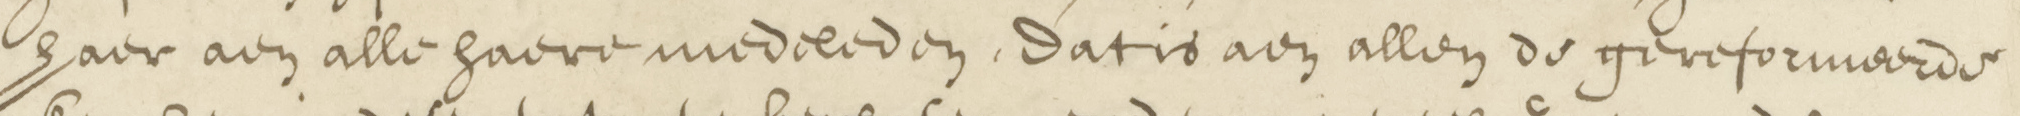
haer aen alle haere medeleden, dat is aen allen de gereformeerde
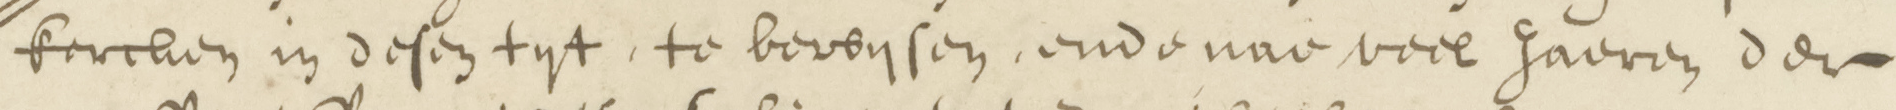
kercken in desen tyt, te bewysen, ende nae veel Jaeren der
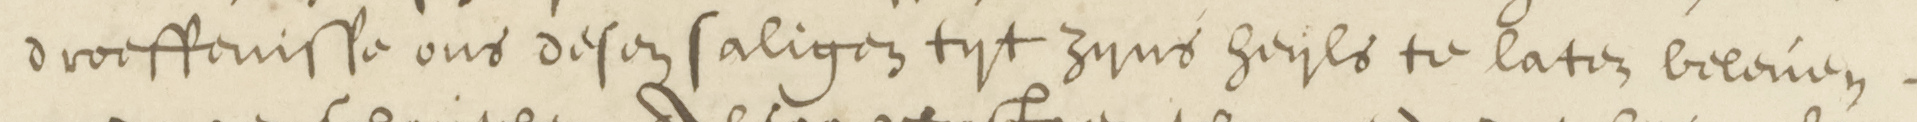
droeffenisse ons desen saligen tyt zyns heyls te laten beleuen
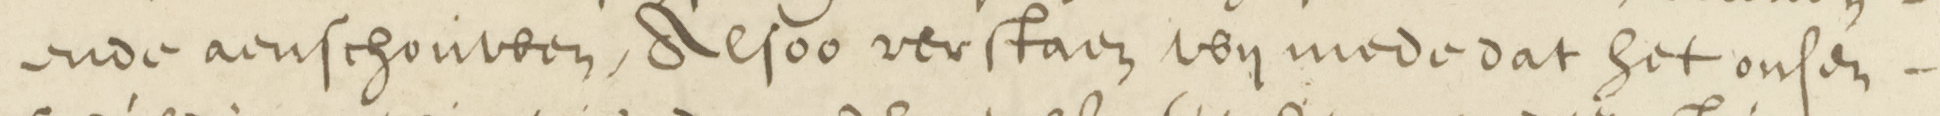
ende aenschouwen. Alsoo verstaen wy mede dat het onsen
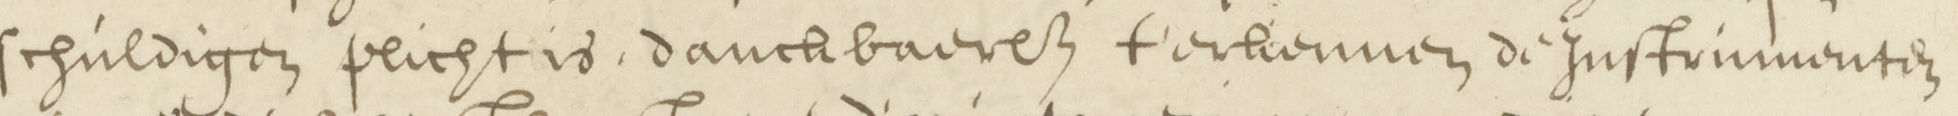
schuldigen plicht is, danckbaerl t‛erkennen de Instrumenten
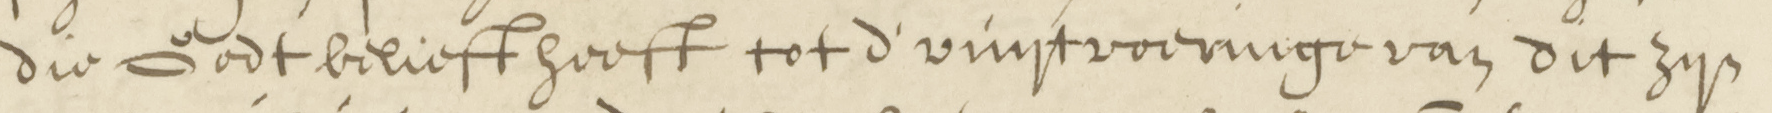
die Godt belieft heeft tot d'vuytvoeringe van dit zyn
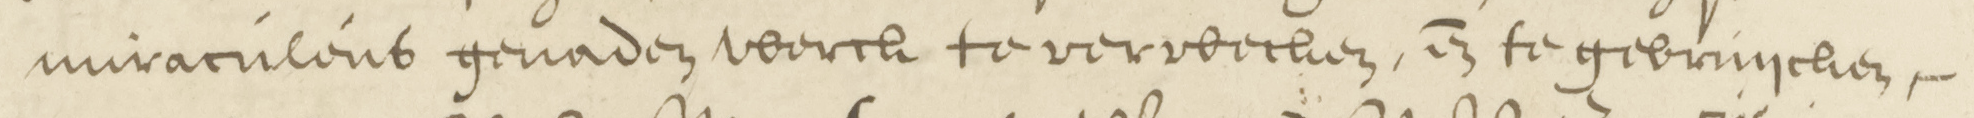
miraculeus genaden werck te verwecken, en te gebruycken,
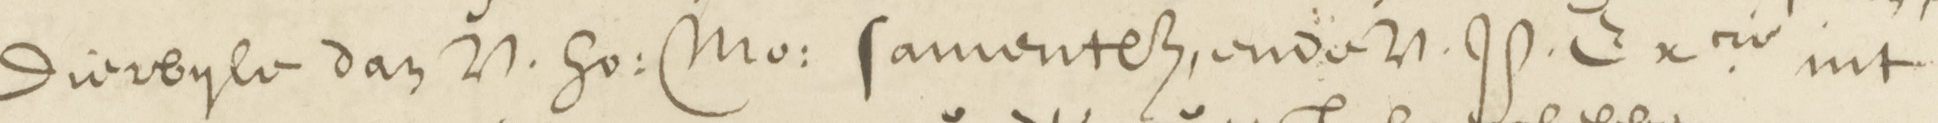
Diewyle dan U. ho:Mo: samentl, ende U. P. Excie. int
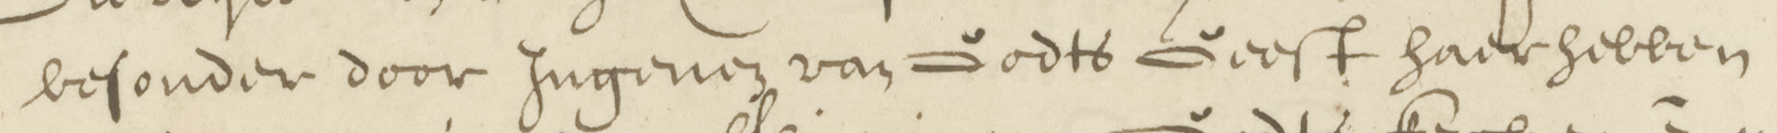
besonder door Ingeuen van Godts Geest haer hebben
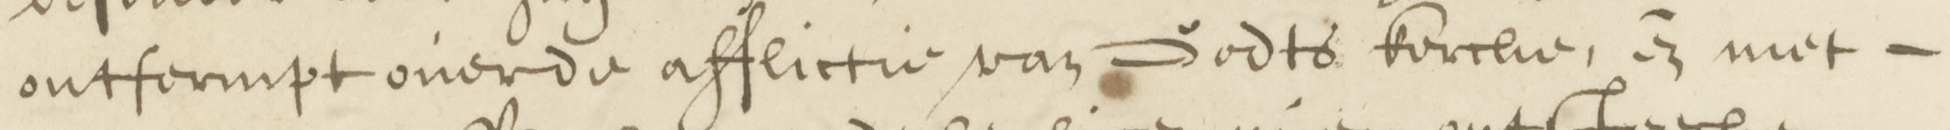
ontfermpt ouer de afflictie van Godts kercke, en met
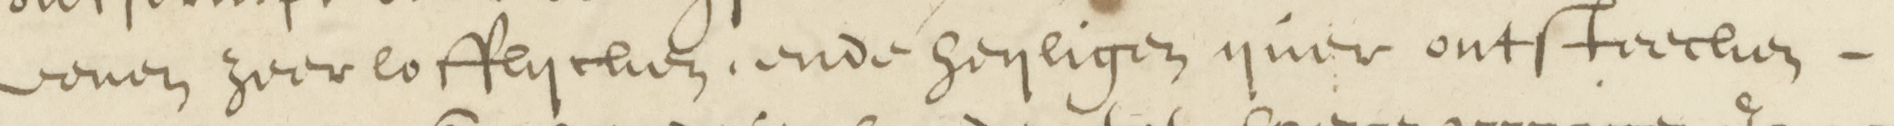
eenen zeer lofflycken, ende heyligen yuer ontsteecken
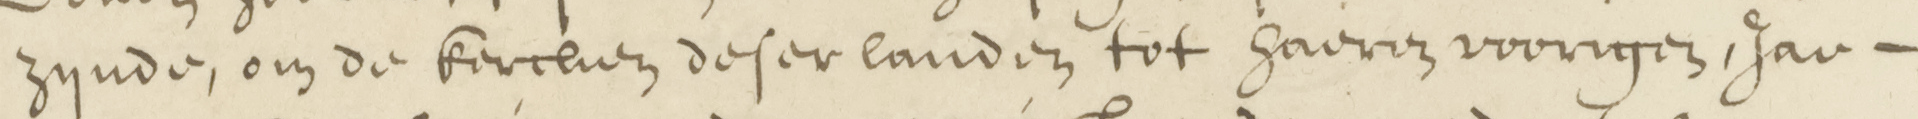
zynde, om de kercken deser landen tot haeren voorigen, Jae
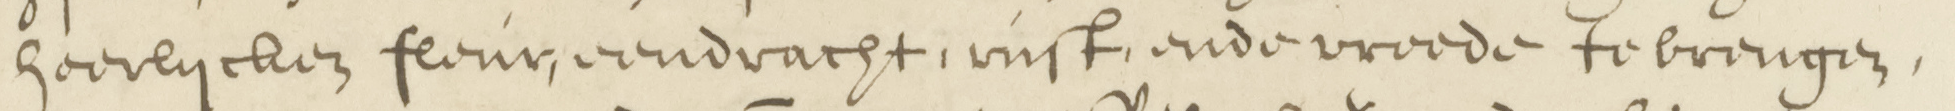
heerlycken fleur, eendracht, rust, ende vreede te brengen,
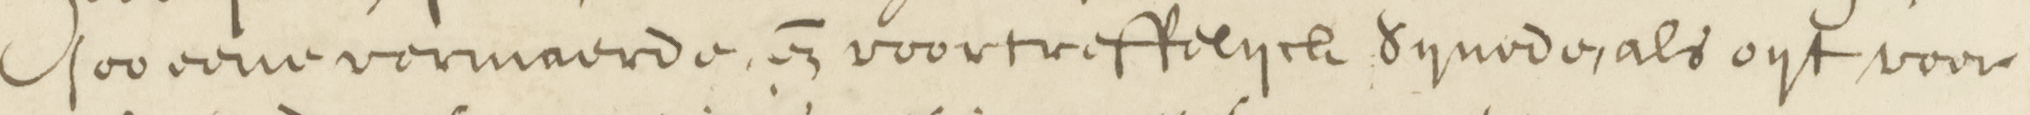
soo eene vermaerde, en voortreffelyck Synode, als oyt voor
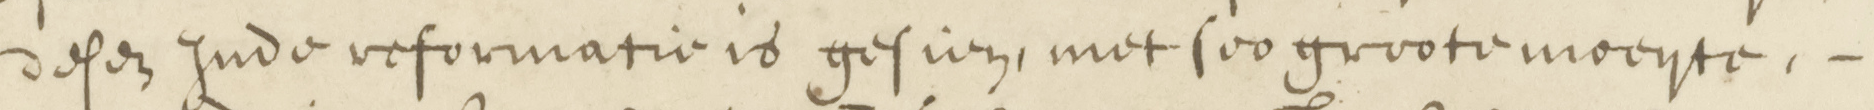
desen Inde reformatie is gesien, met soo groote moeyte,
